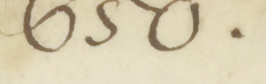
650.
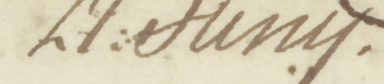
27. Junij.
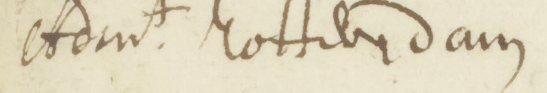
Admt. Rotterdam
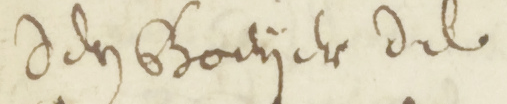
den Boeijer de
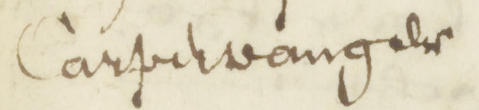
Carpervanger
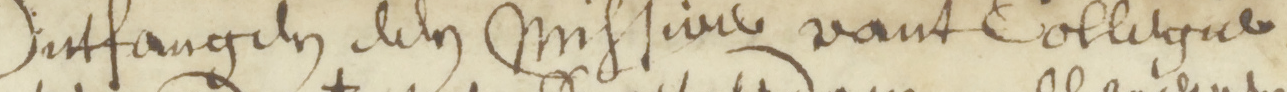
Ontfangen een Missive vant Collegie
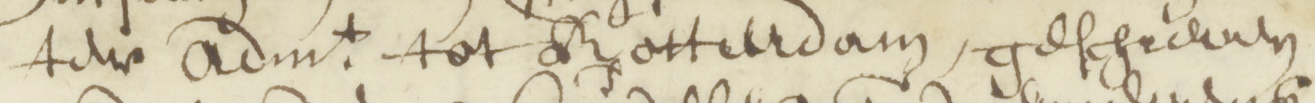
ter Admt. tot Rotterdam, geschreven
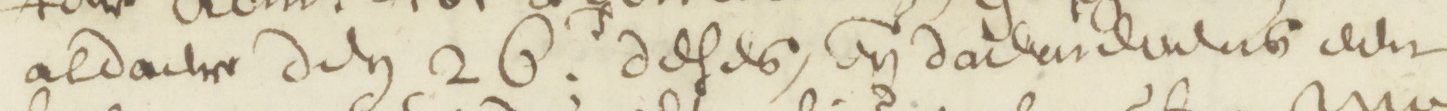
aldaer den 26en, deses, en daernevens een
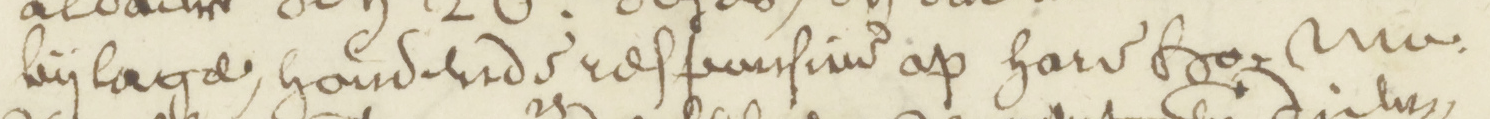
bijlage, houdende resumptie op hare Ho:Mo:
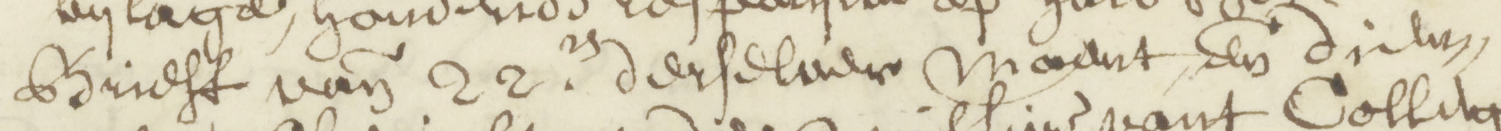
Brieff van 22en. derselver Maent en dien„
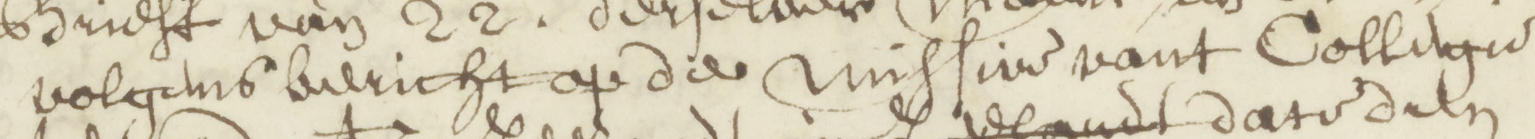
volgens bericht op de Missive vant Collegie
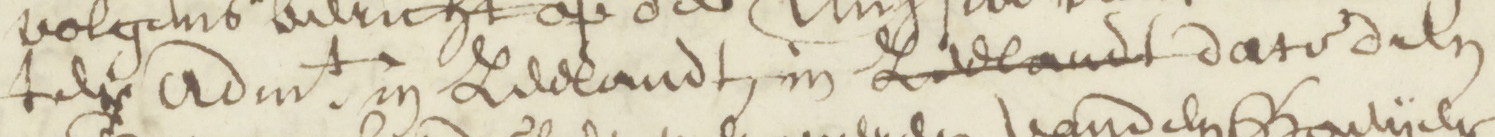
ter Admt. in Zeelandt, in Zeelandt date den
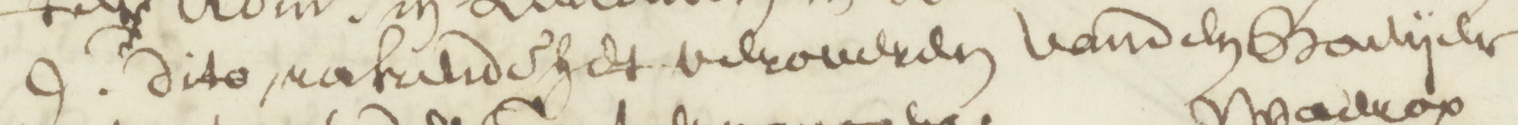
9e. dito rakende het veroveren vanden Boeijer
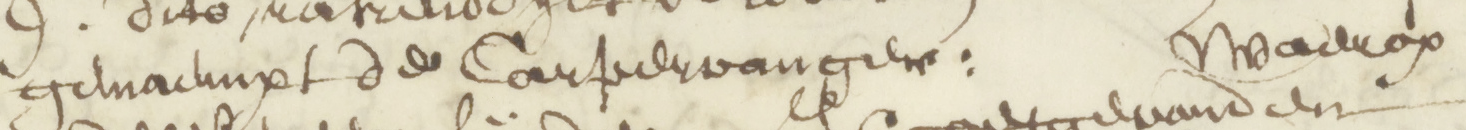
genaempt de Capervanger: Waerop
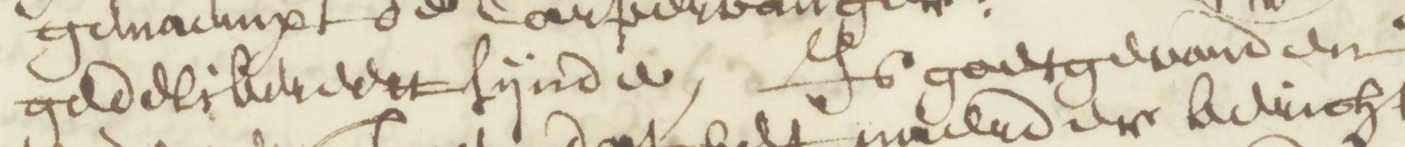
gedelibereert sijnde, Is goetgevonden
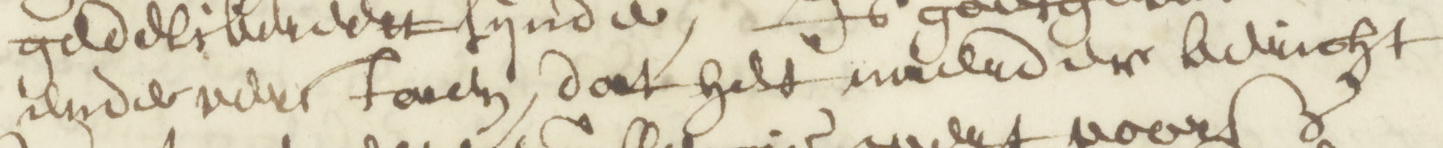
ende verstaen, dat het naerder bericht
